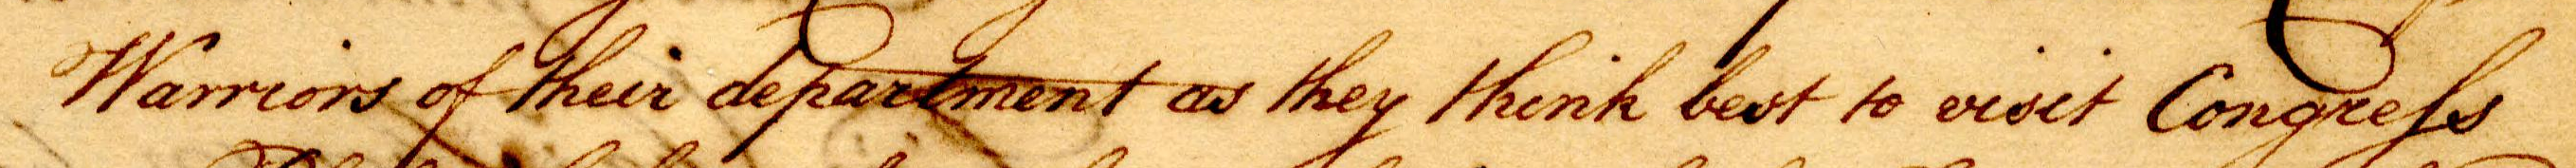Warriors of their department as they think best to visit Congress
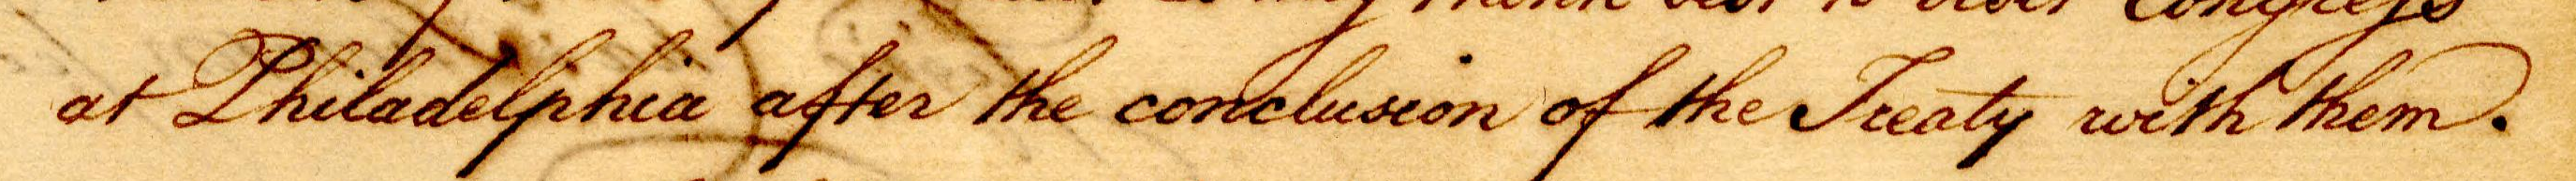at Philadelphia after the conclusion of the Treaty with them.
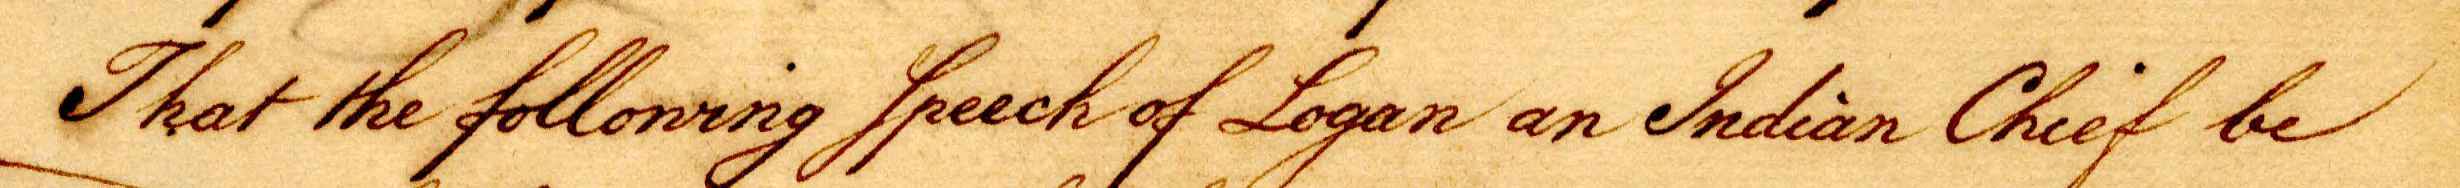That the following Speech of Logan an Indian Chief be
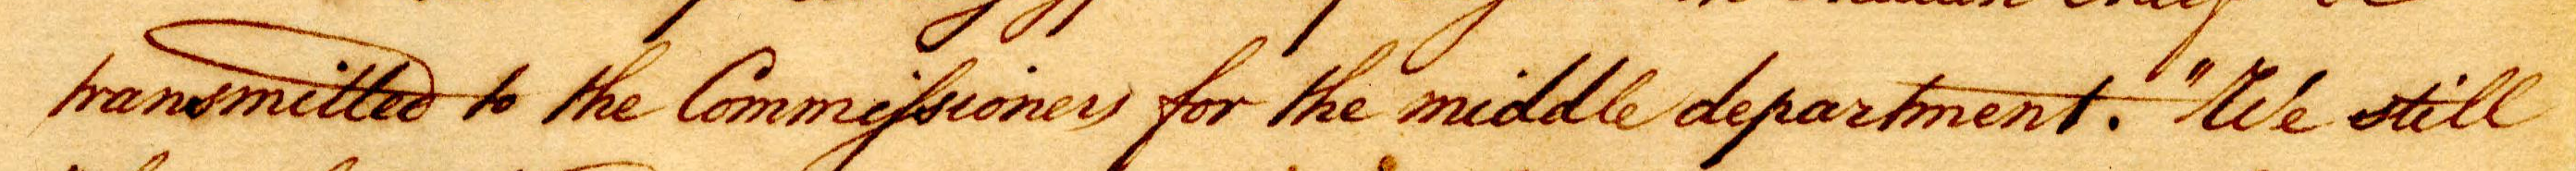transmitted to the Commissioner for the middle department. "We still
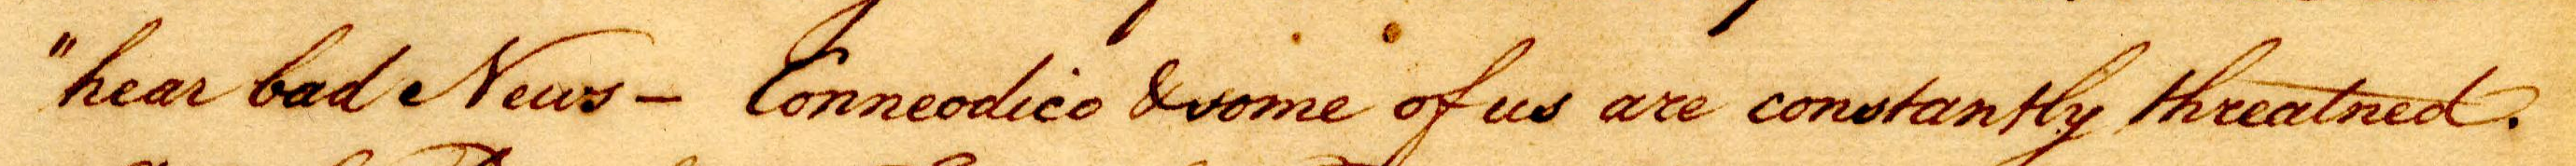"hear bad News- Conneodico & some of us are constantly threatened.
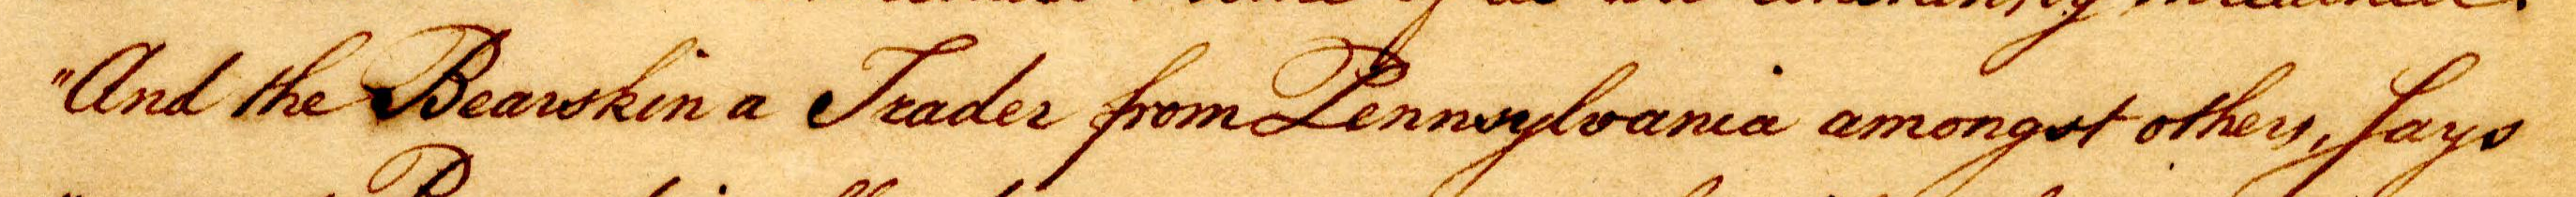"And the Bearskin a Trader from Pennsylvania amongst others, Says
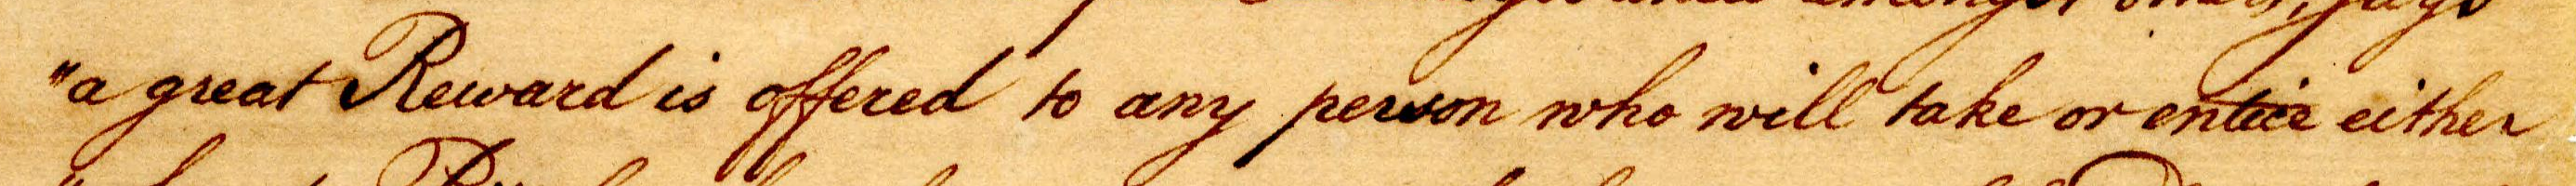"a great Reward is offered to any person who will take or entice either
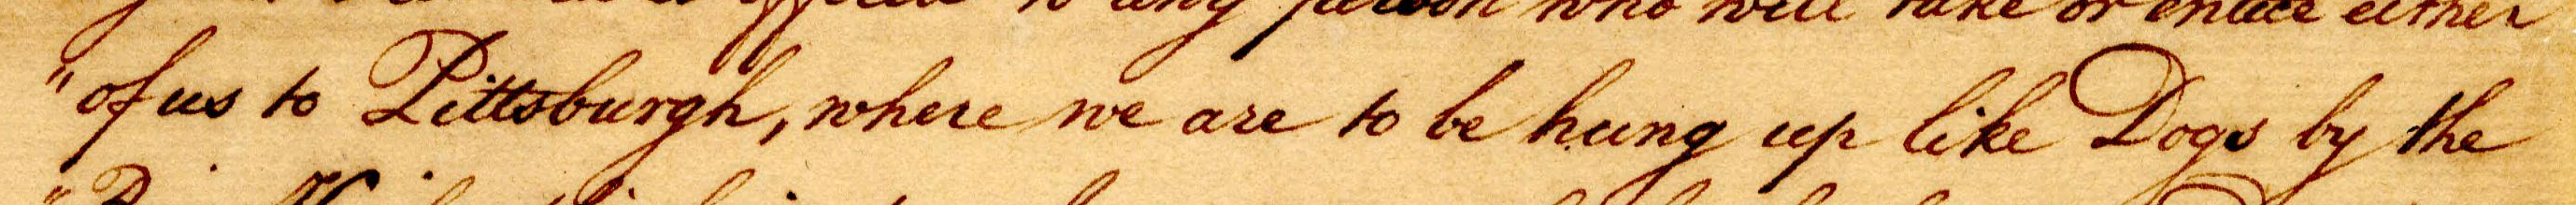"of us to Pittsburgh, where we are to be hung up like Dogs by the
